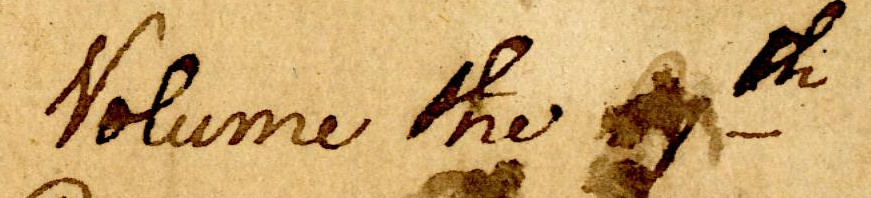Volume the 7^th
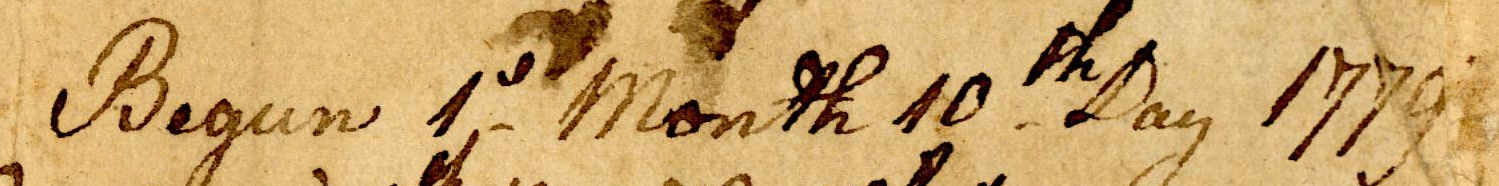Begun 1^st Month 10^th Day 1779
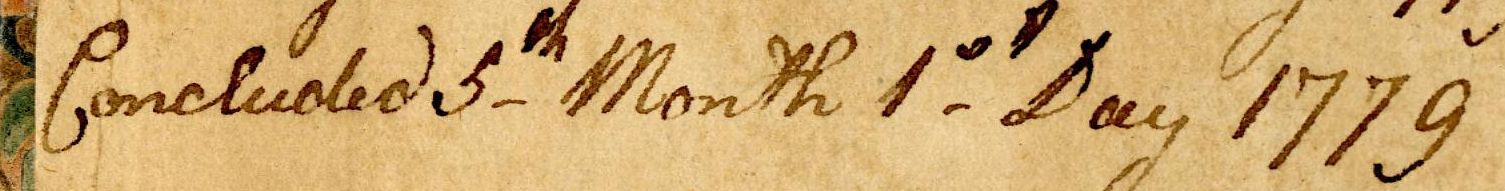Concluded 5^th Month 1^st Day 1779
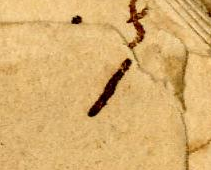1
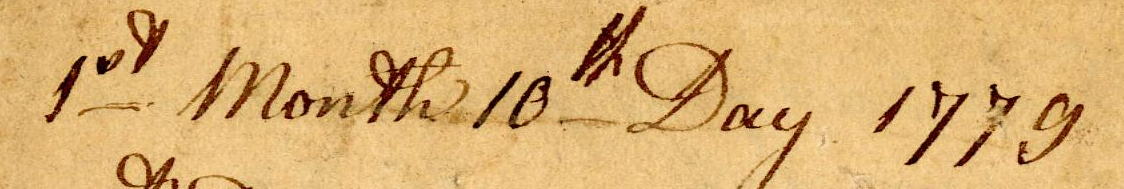1^st Month 10^th Day 1779
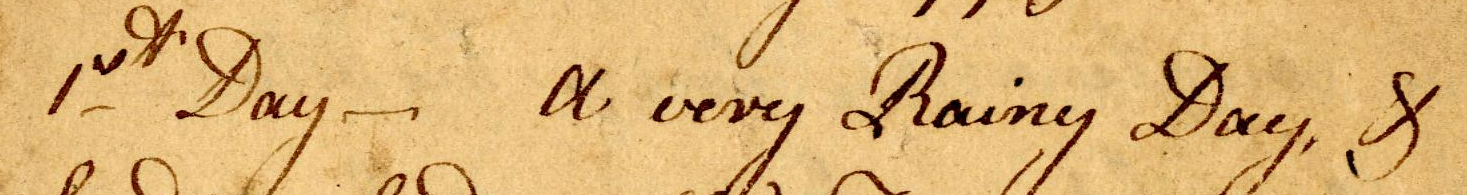1^st Day- A very Rainy Day, &
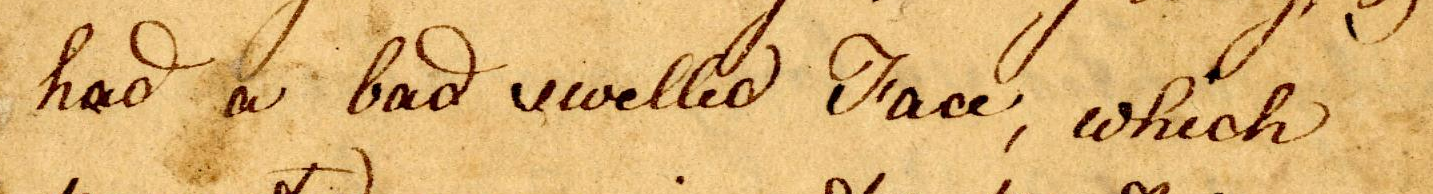had a bad swelled Face, which
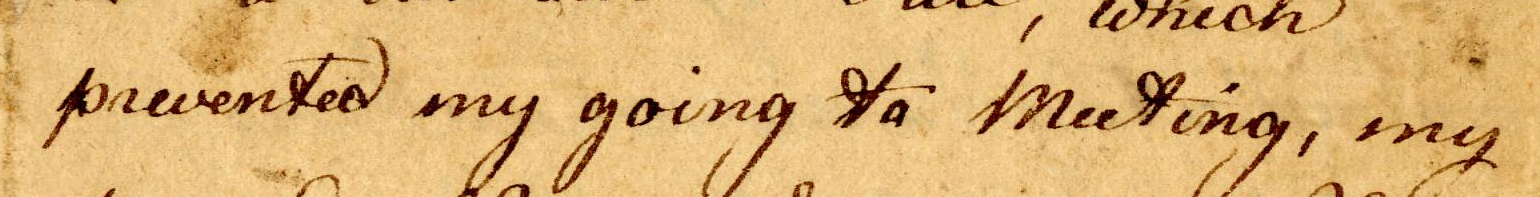prevented my going to Meeting, my
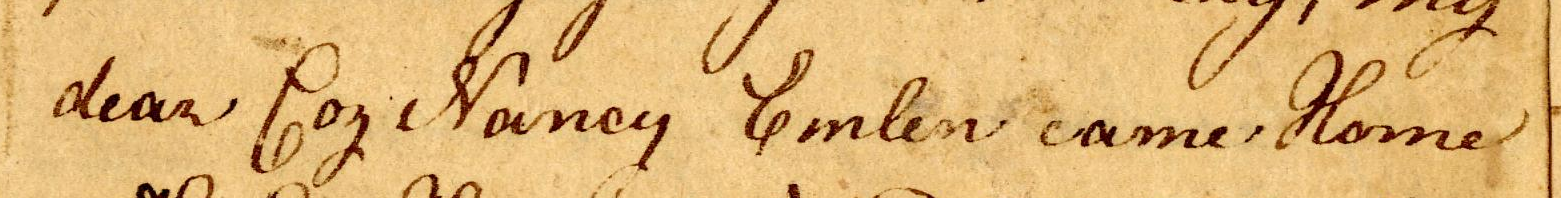dear Coz Nancy Emlen came Home
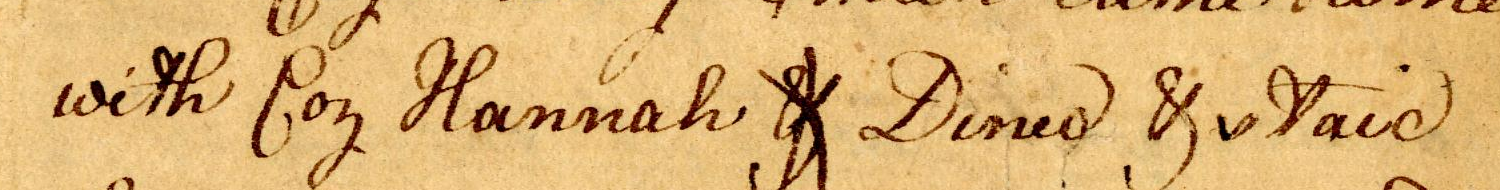with Coz Hannah & Dined & staid
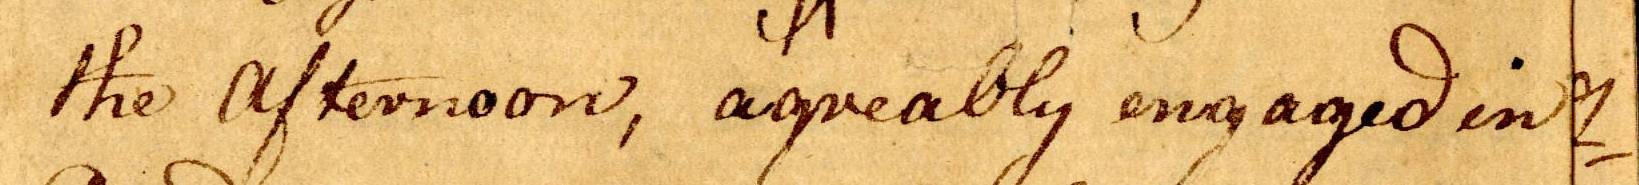the Afternoon, agreably engaged in
